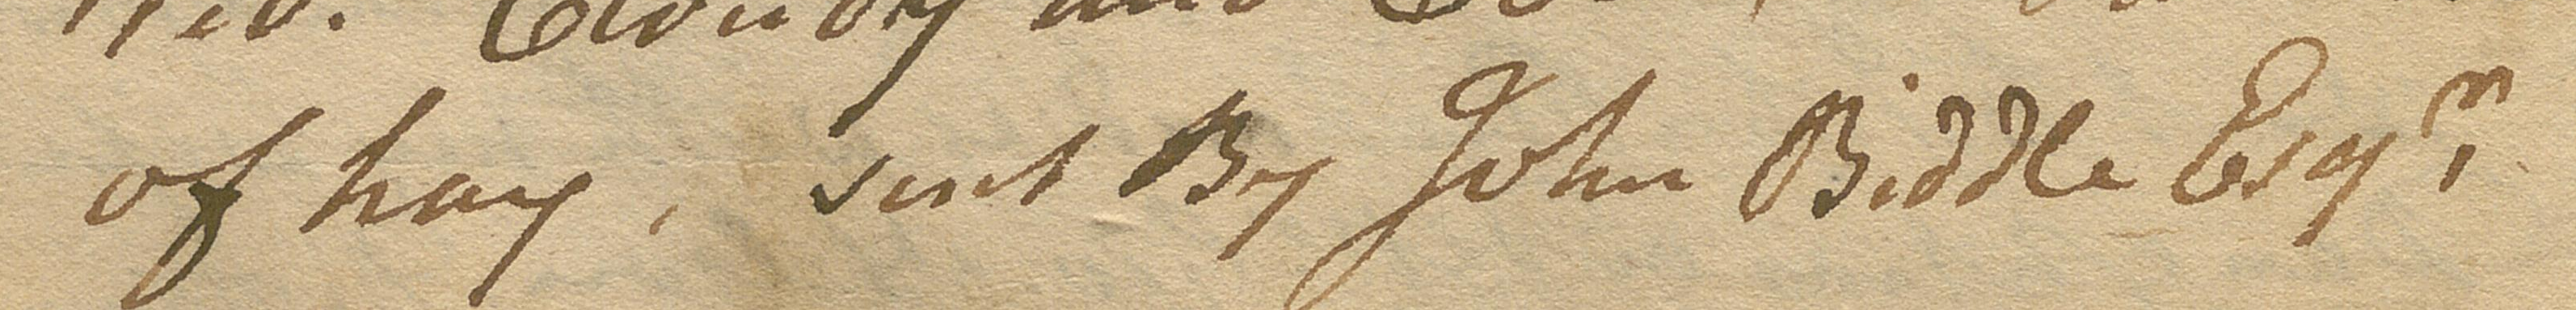of hay. sent By John Biddle Esq^rs.
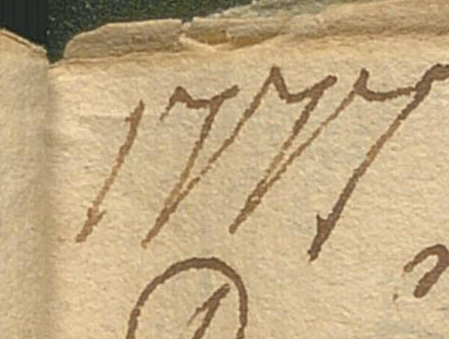1777
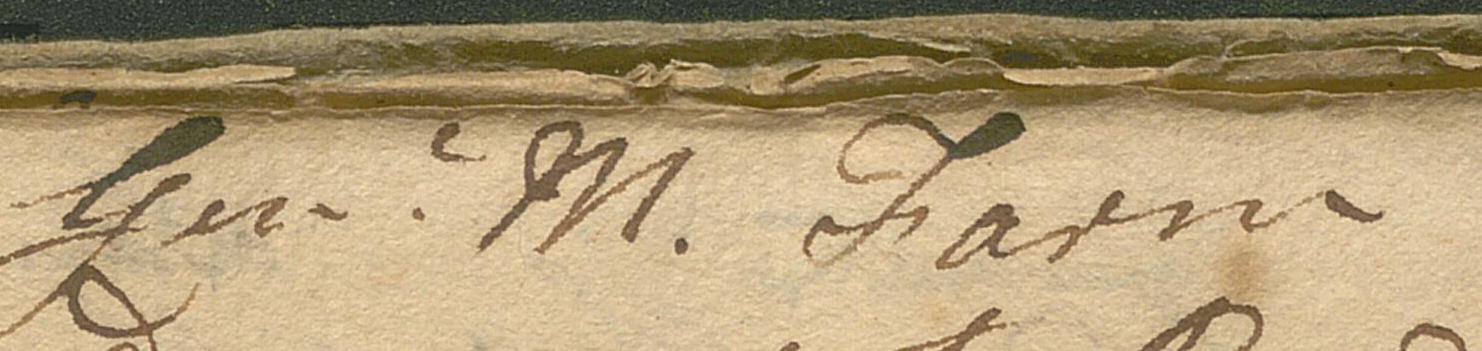Gen^l. M. Farm
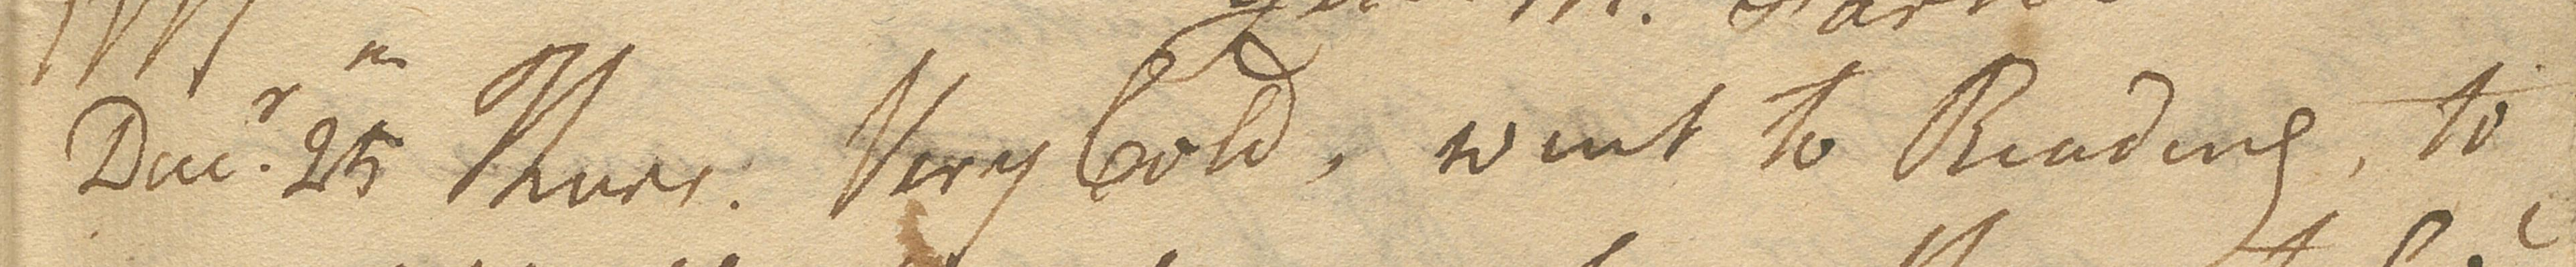Dece^r. 25 Thurs. Very Cold. went to Reading, to
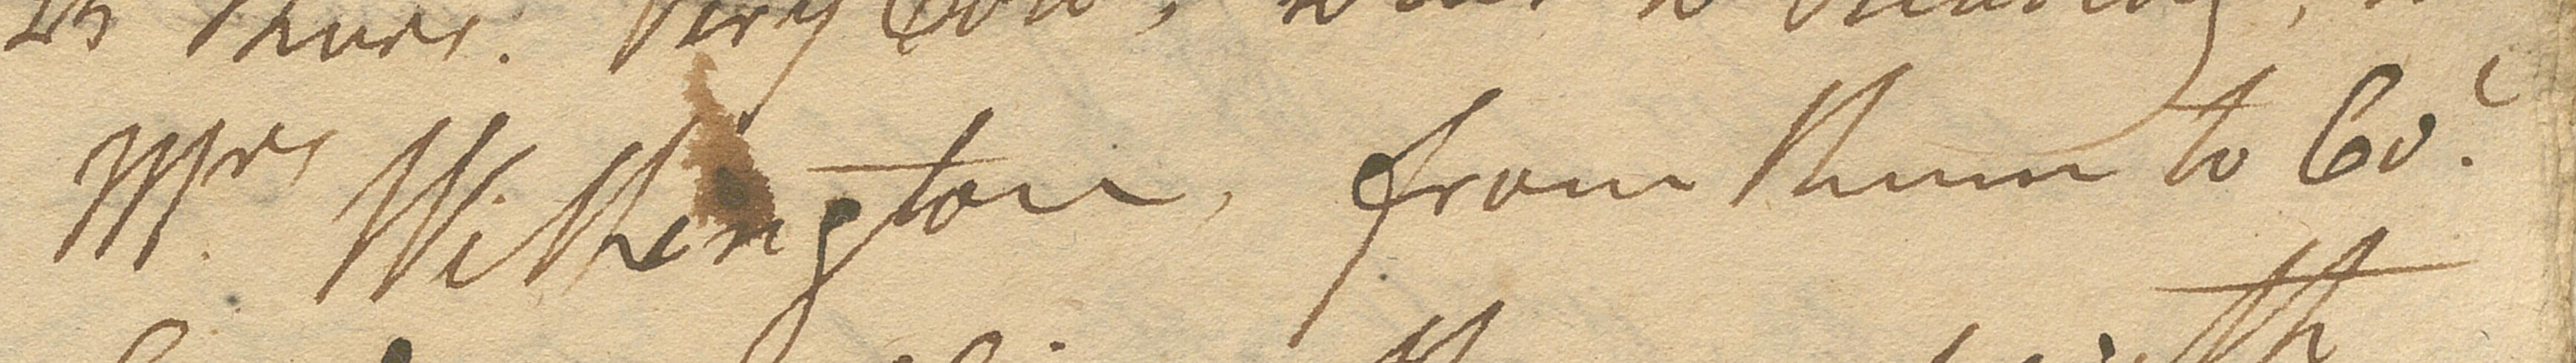M^rs. Withington, from thence to Co^l.
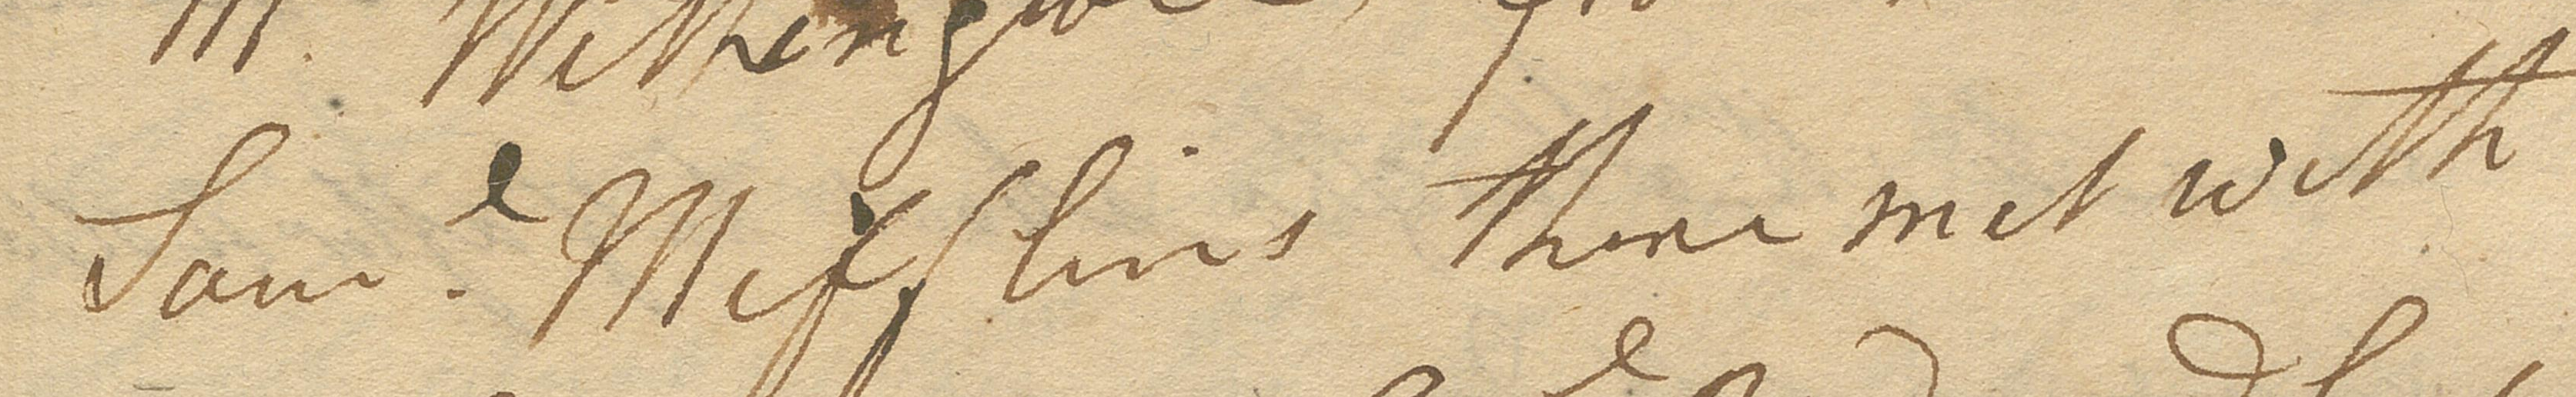Sam^l. Mefflins there met with
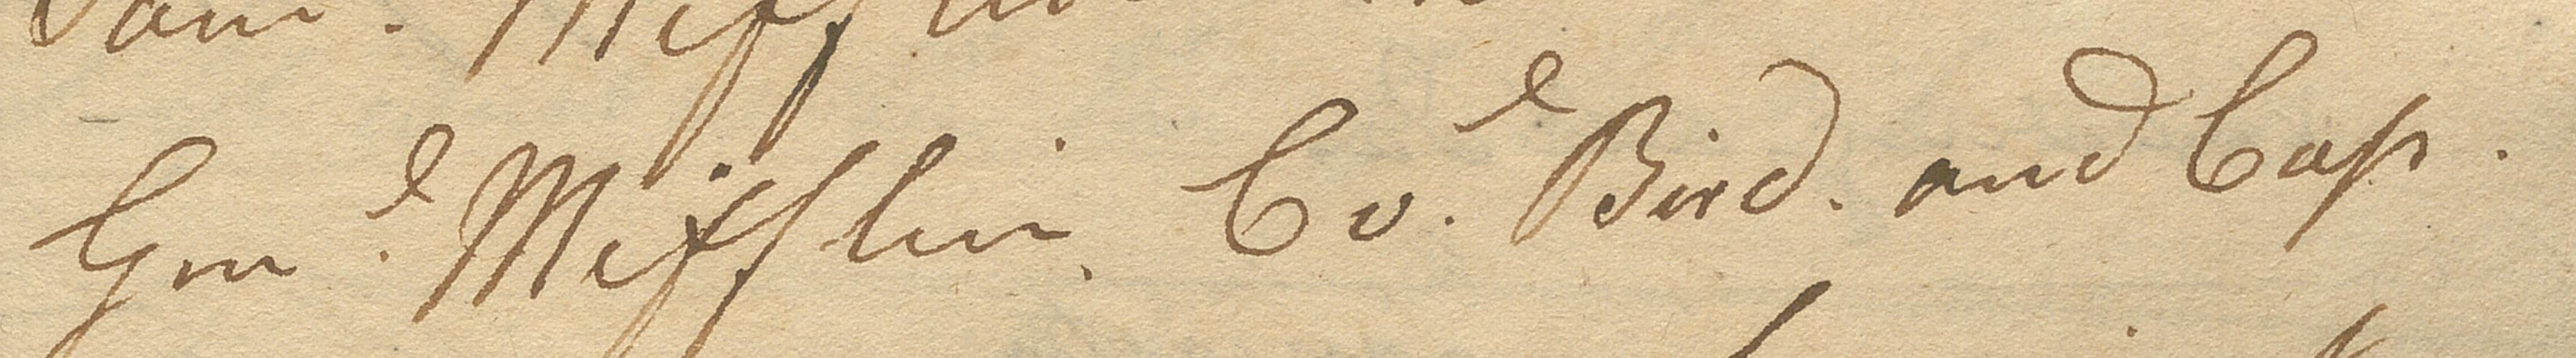Gen^l. Mifflin Co^l. Bird. and Cap.
